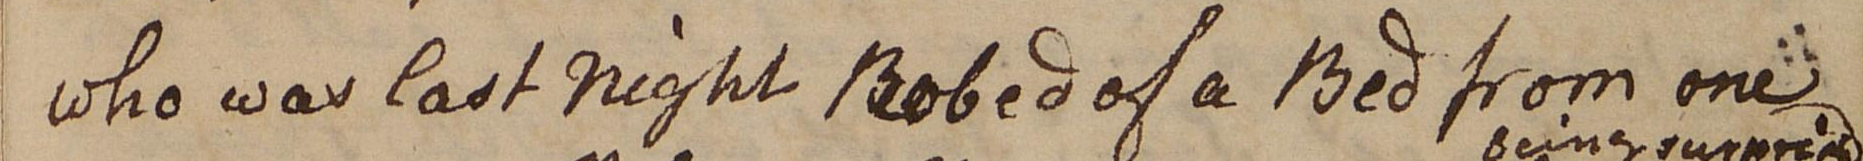who was last Night Robed of a Bed from one,
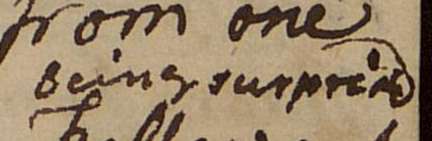being surprisd
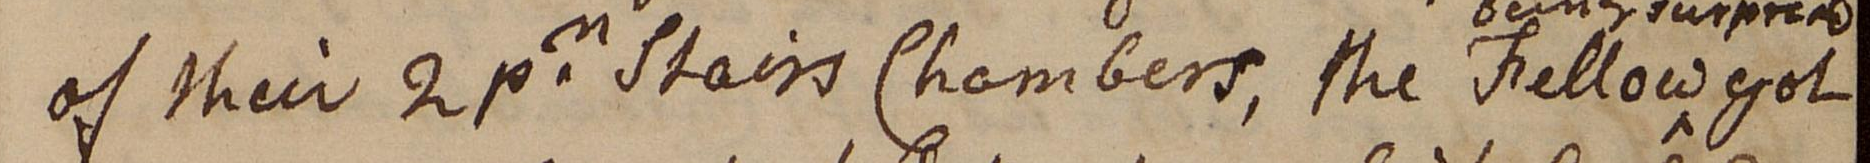of their 2 p^m. Stairs Chambers, the Fellow ^ got
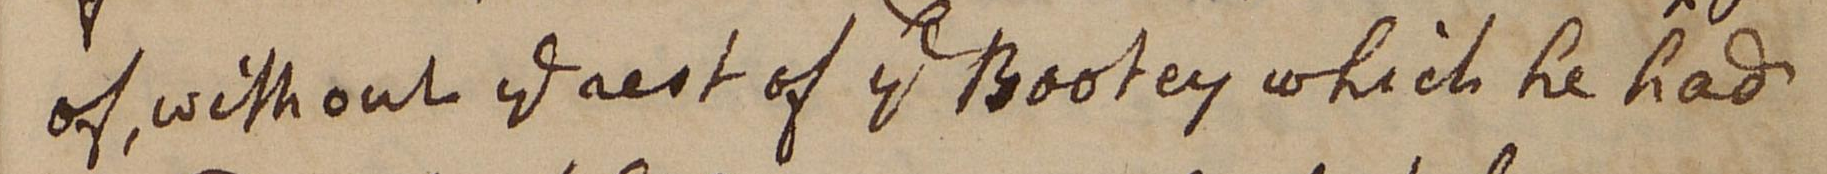of, without y^e rest of y^e Rootey which he had
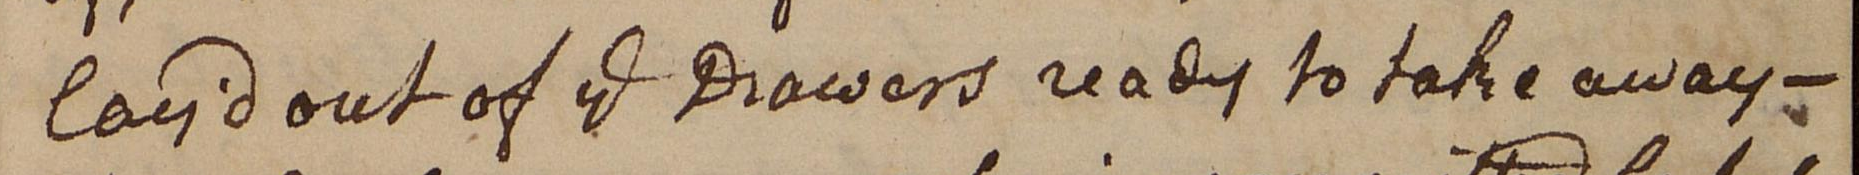lay'd out of y^e Drawers ready to take away-
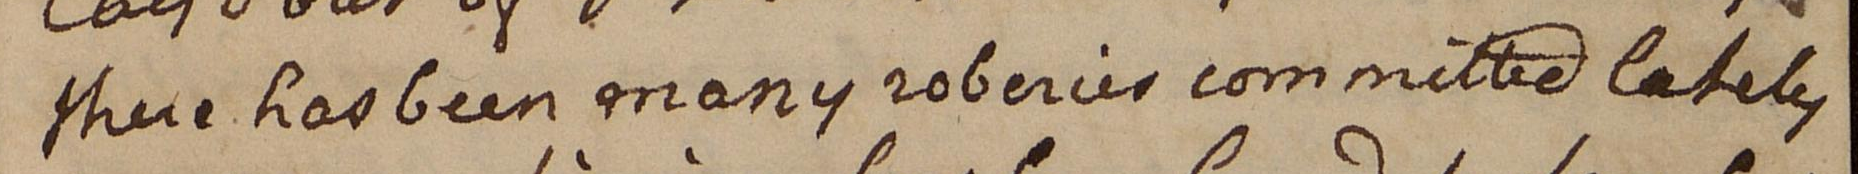there has been many roberies committed lately
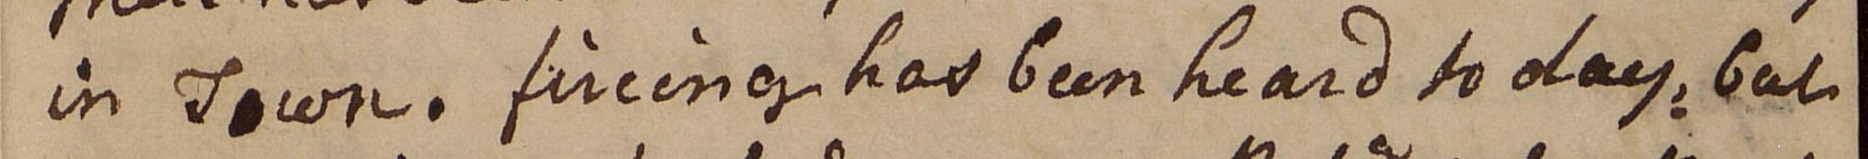in Town. fireing has been heard to day, but
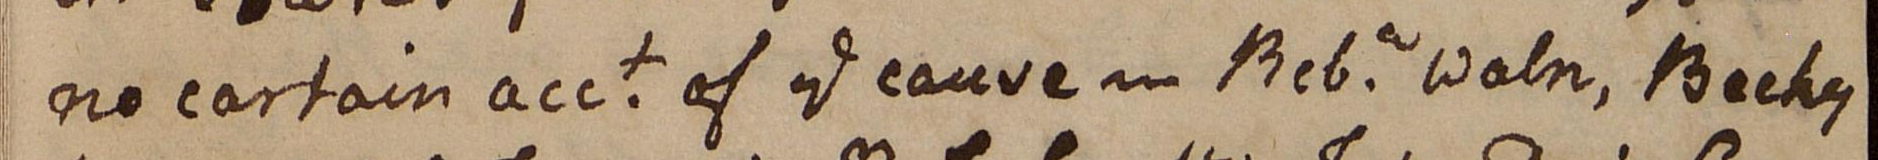no cartain acc^t. of y^e cause - Reb^a. Waln, Becky
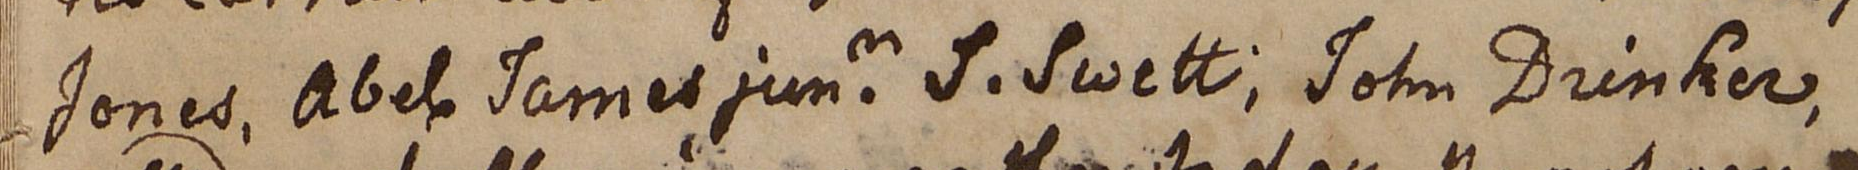Jones, Abel James jun^r. S. Swett; John Drinker,
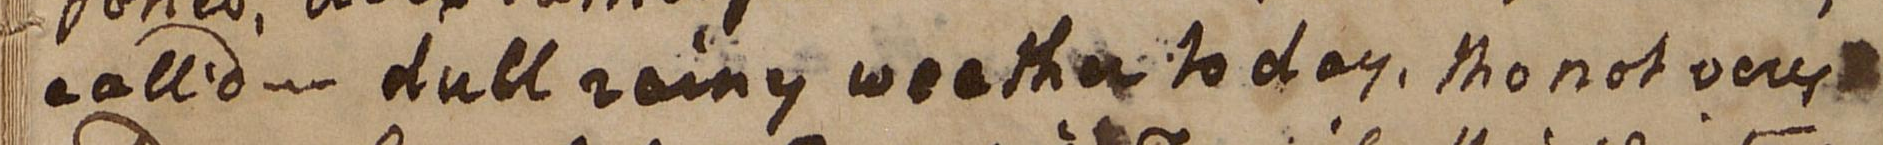call'd- dull rainy weather to day, tho not very
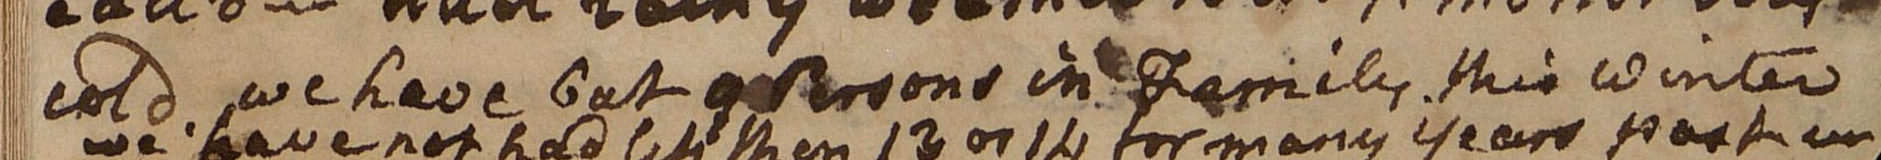cold, we have but a Persons in Family this winter
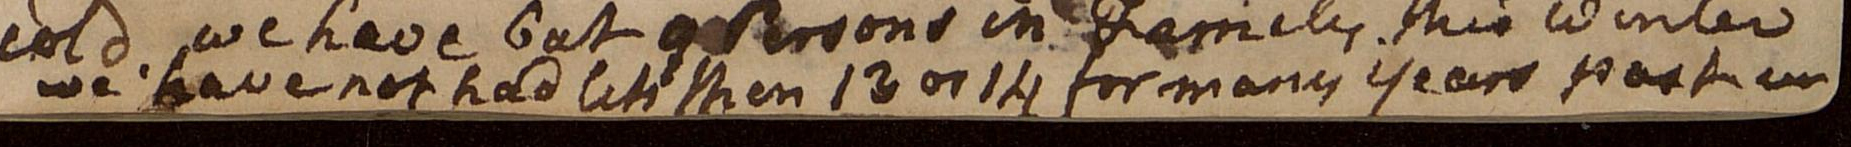we have not had less then 13 or 14 for many years past-
